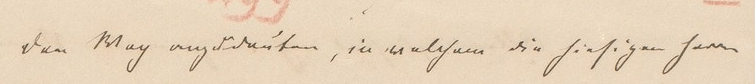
den Weg anzudeuten, in welchem die hiesigen Herren
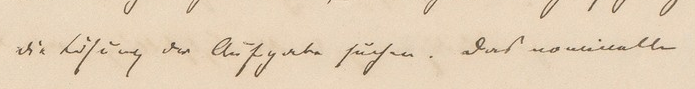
die Lösung der Aufgabe suchen. Das nominelle
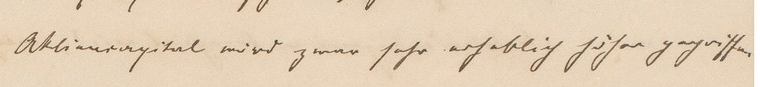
Aktiencapital wird zwar sehr erheblich höher gegriffen
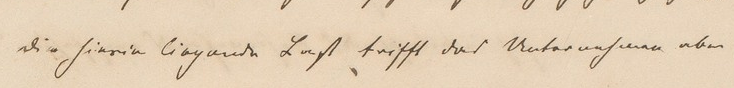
die hierin liegende Last trifft das Unternehmen aber
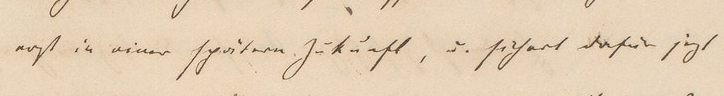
erst in einer spätern Zukunft, u. sichert dafür jezt
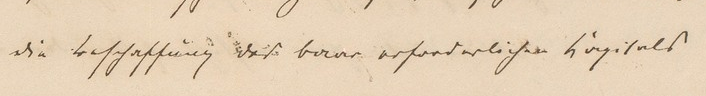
die Beschaffung des baar erforderlichen Capitals
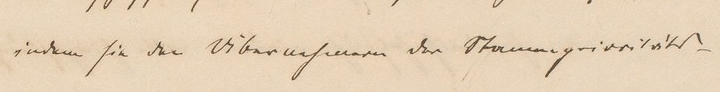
indem sie den Übernehmern der Stammprioritäts-
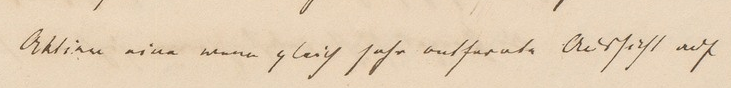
Aktien eine wenn gleich sehr entfernte Aussicht auf
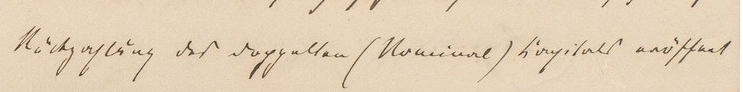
Rückzahlung des doppelten (Nominal) Capitals eröffnet
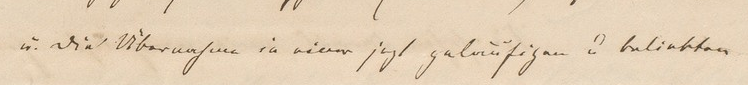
u. die Übernahme in einer jezt geläufigen u beliebten
